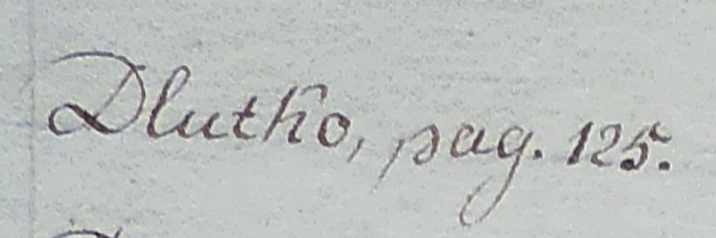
Dlutko, pag. 125.
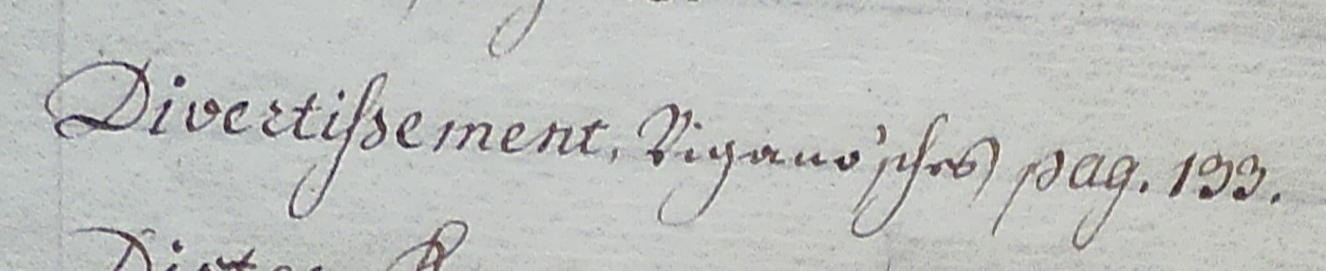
Divertissement, Vigano'sches pag. 133.
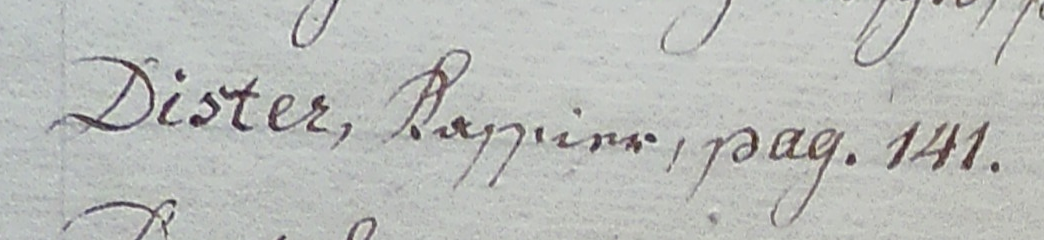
Dister, Kassier, pag. 141.
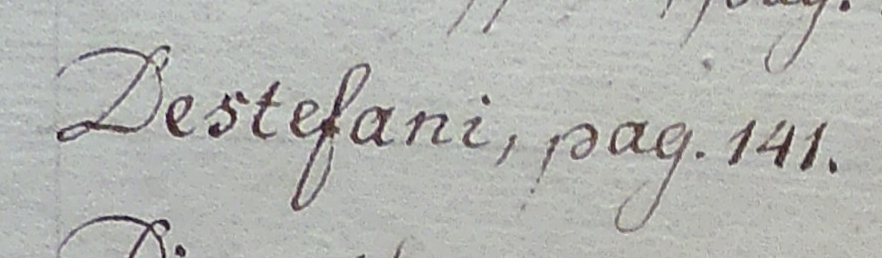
Destefani, pag. 141.
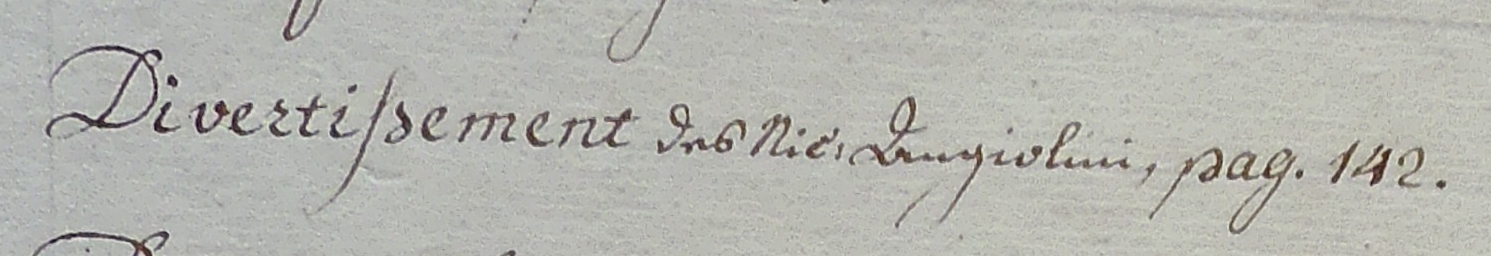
Divertissement des Nic. Angiolini, pag. 142.
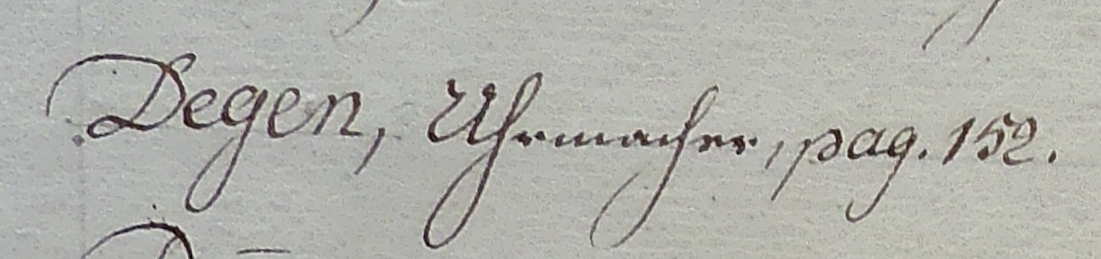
Degen, Uhrmacher, pag. 152.
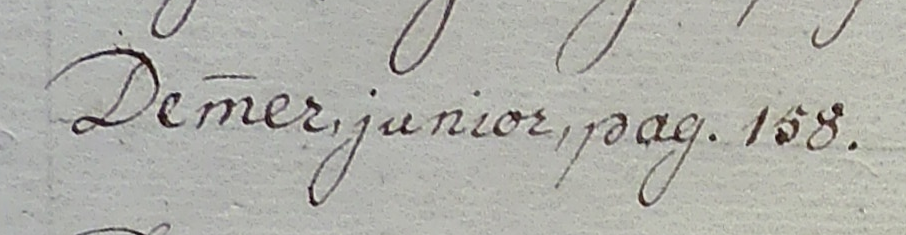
Dem̅er, junior, pag. 158.
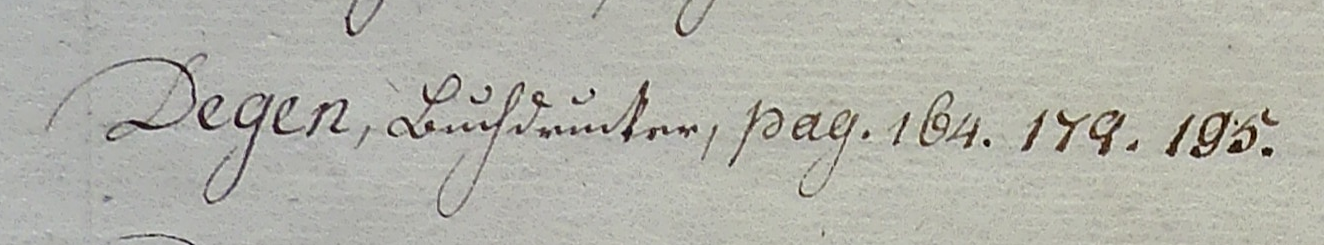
Degen, Buchdrucker, pag. 164. 179. 195.
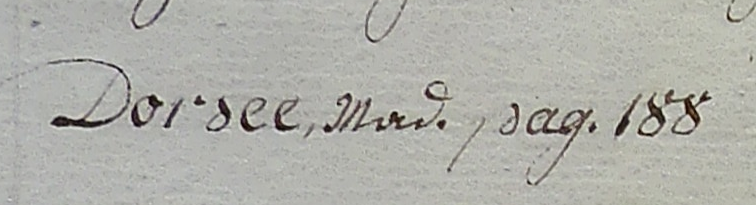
Dorsee, Mad. pag. 188
